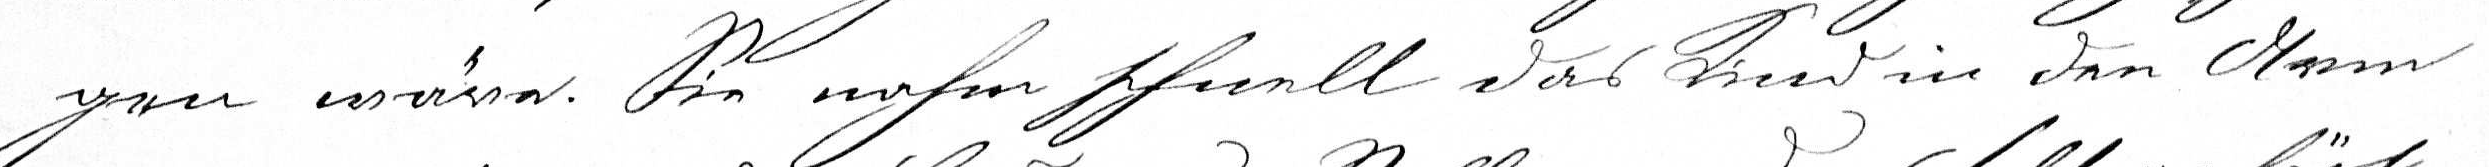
gen wäre. Sie nahm schnell das Kind in den Arm
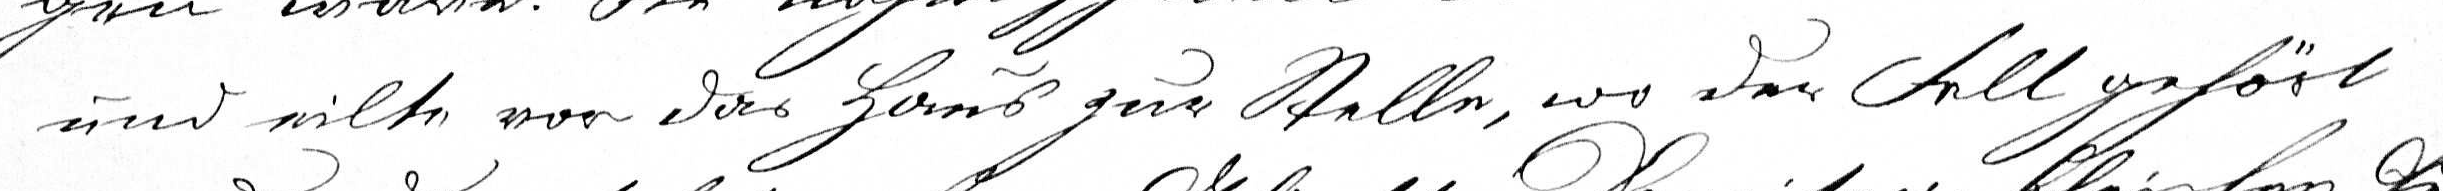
und eilte von das Haus zur Stelle, wo der Fall gehört
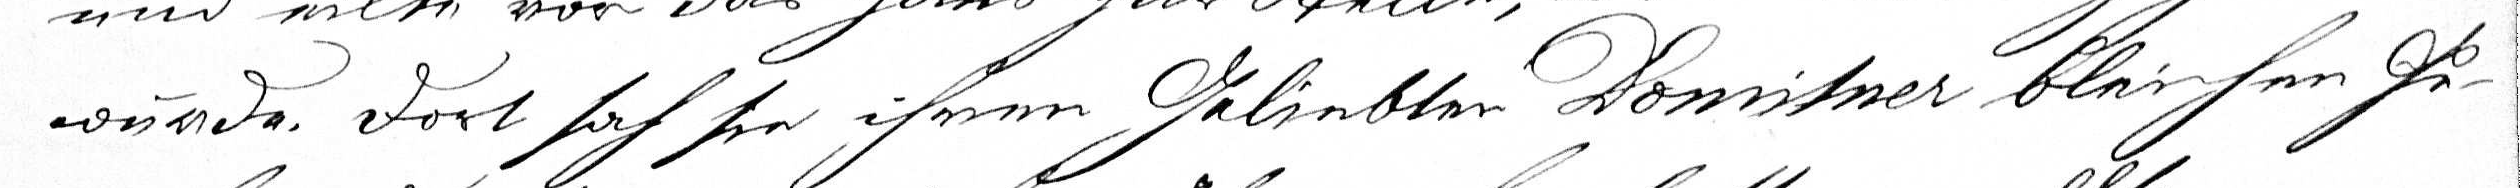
wurde. Dort sah sie ihren Geliebten Domitner bleichen Ge¬
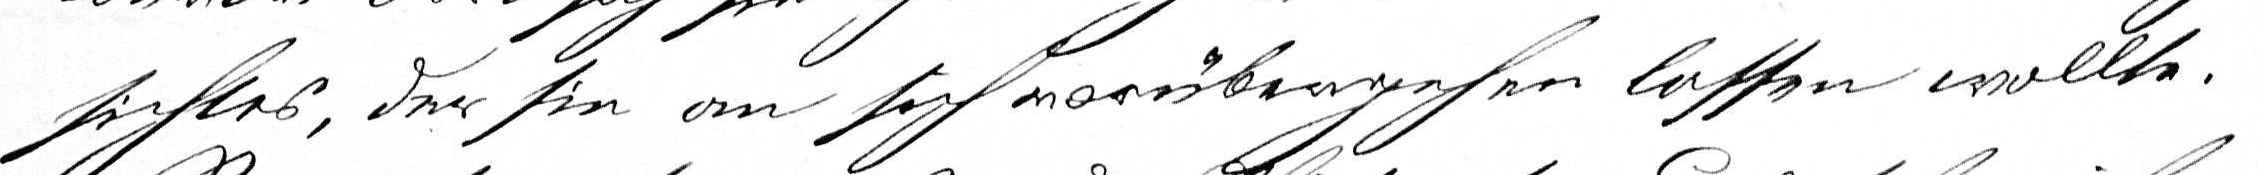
sichtes, der sie an sich vorübergehen lassen wollte.
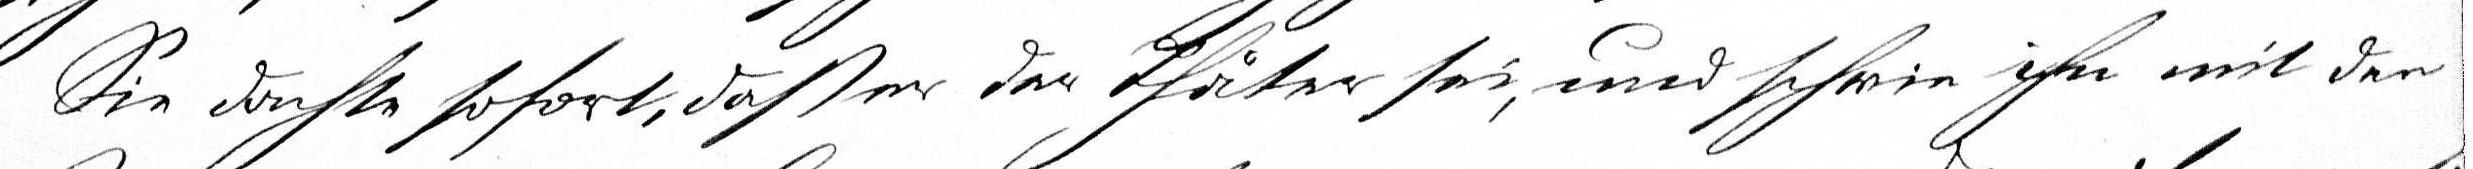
Sie dachte sofort, daß er der Thäter sei, und schrie ihn mit den
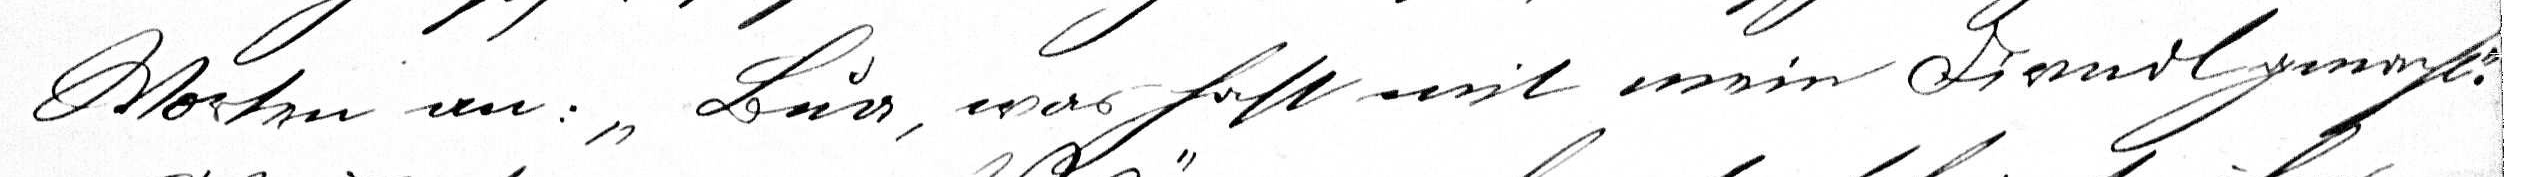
Worten an „Bua, was hast mit mein Dirndl gemacht.“
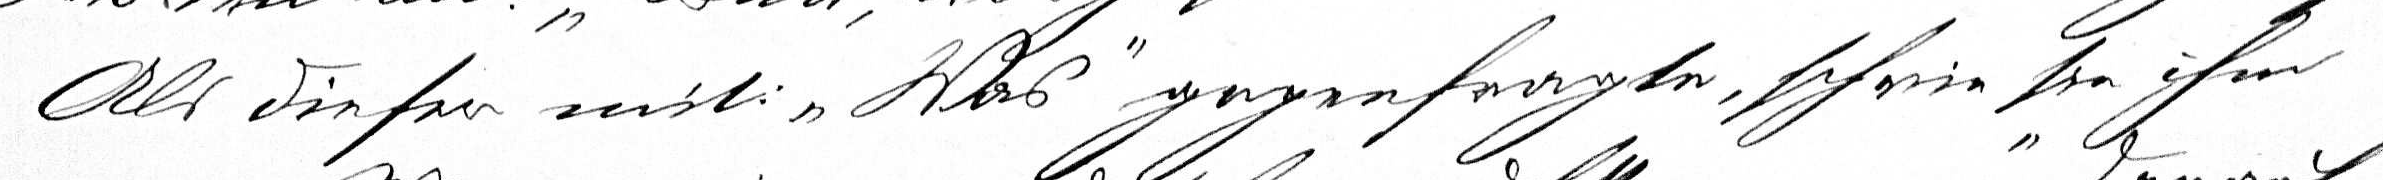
Als dieser mit: „Was“ gegenfragte, schrie sie ihm
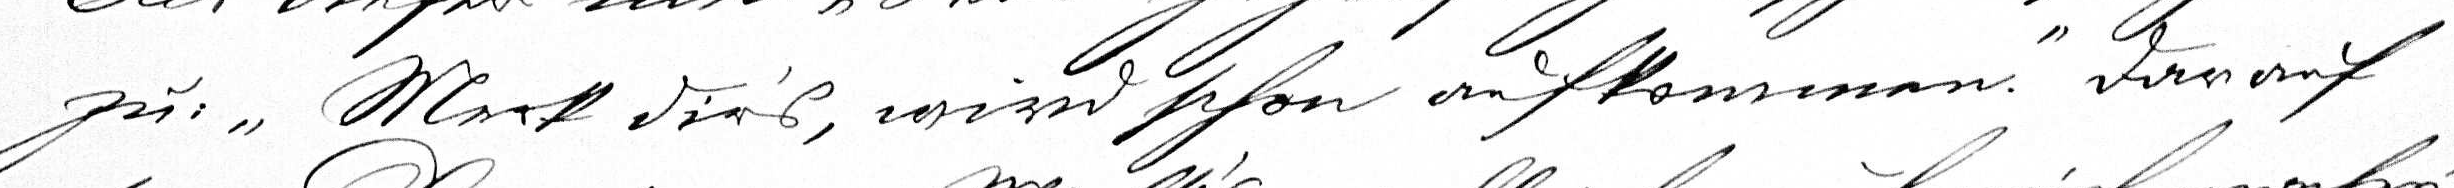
zu: „Merk dir’s, wird schon aufkommen.“ Darauf
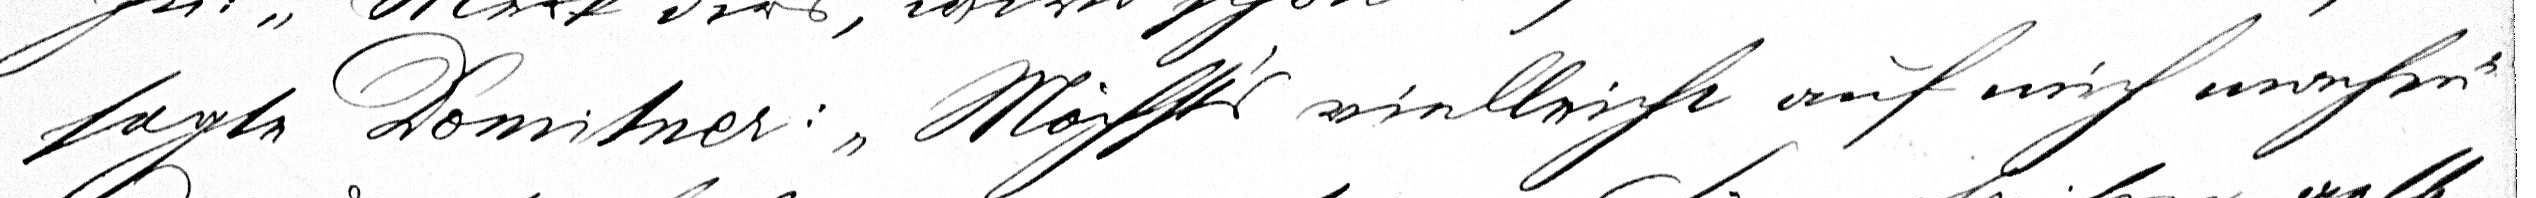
sagte Domitner: „Möchte’s vielleicht auf mich machen“
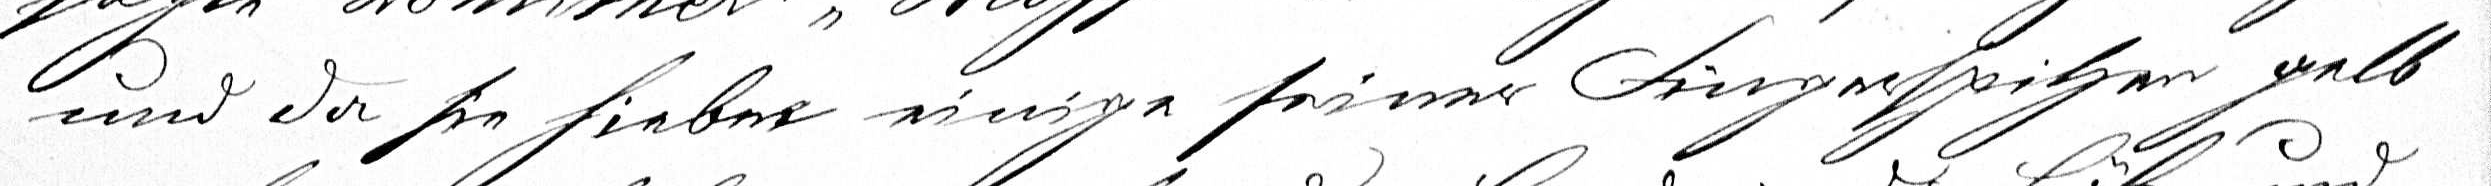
und da sie hiebei einige seiner Fingerspitzen gelb
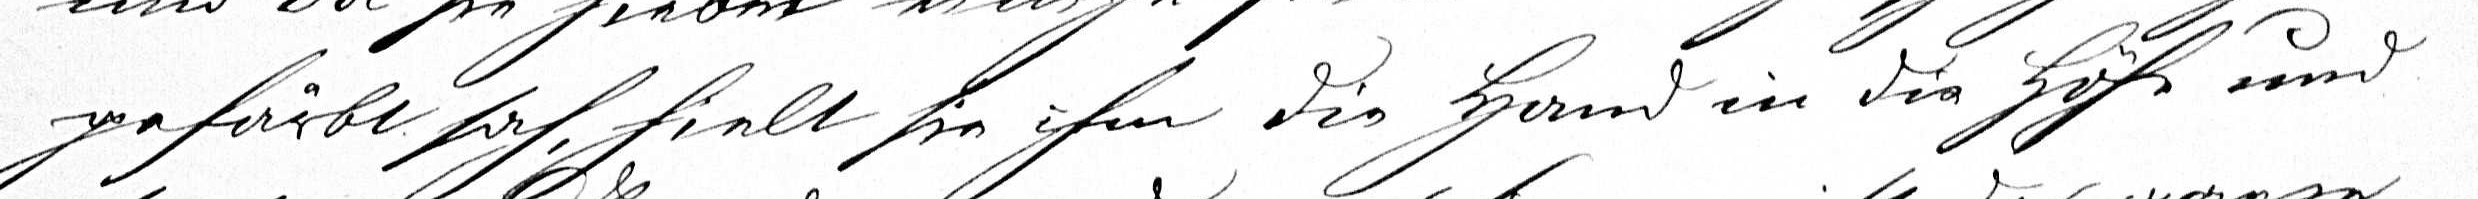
gefärbt sah, hielt sie ihm die Hand in die Höhe und
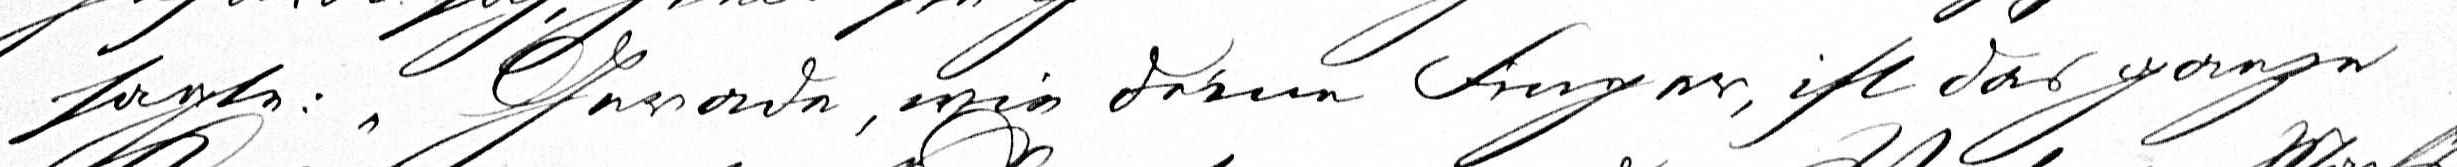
sagte: „Gerade, wie deine Finger, ist das ganze
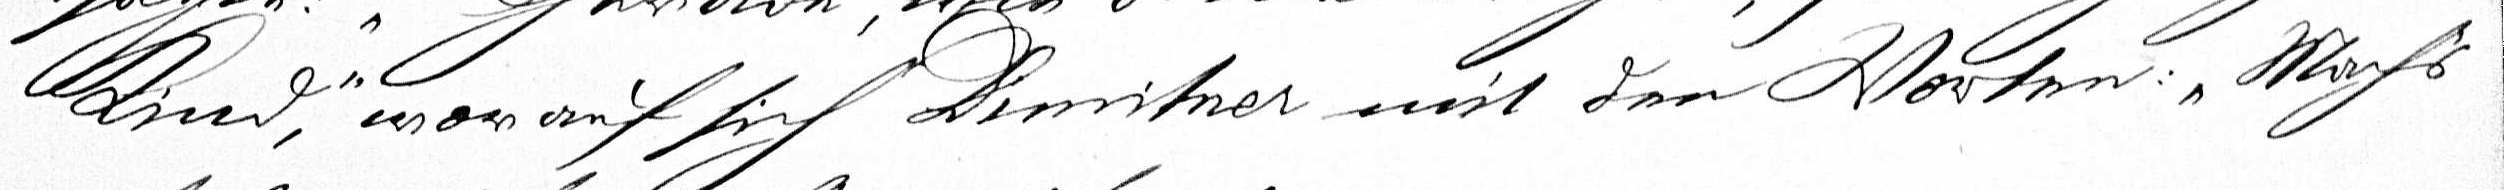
Kind,“ worauf sich Dimitner mit den Worten: „Mach’s
